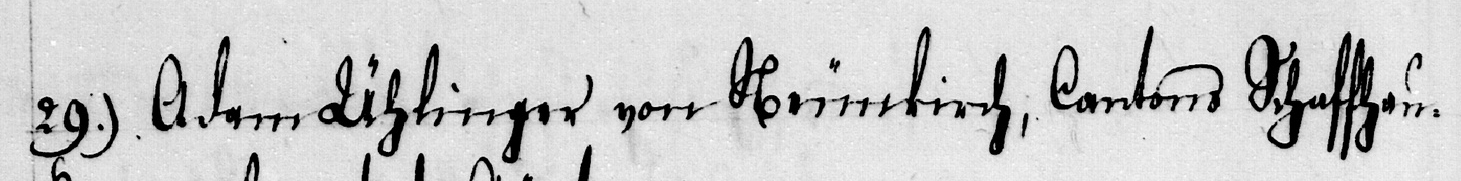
29.) Adam Ühlinger von Neunkirch, Cantons Schaffha¬
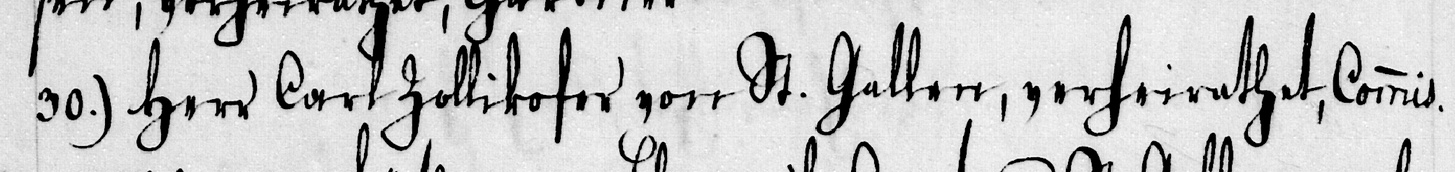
30.) Herr Carl Zollikofer von St. Gallen, verheirathet, Comm¬
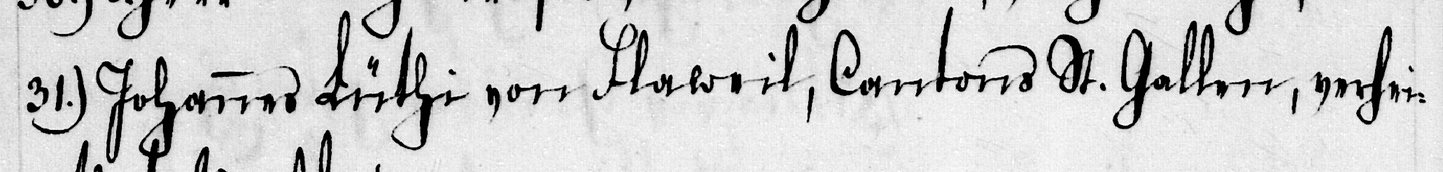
31.) Johannes Lüthi von Flaweil, Cantons St. Gallen, verhe¬
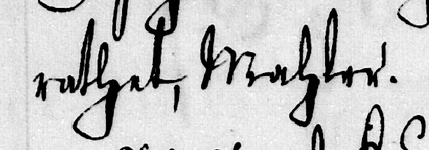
irathet, Mahler.
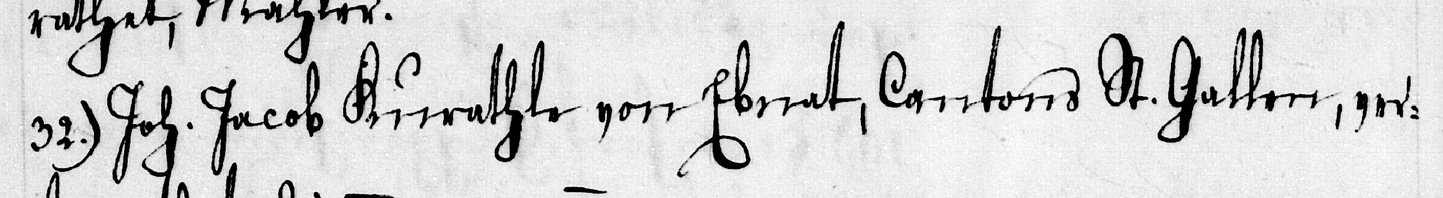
32.) Joh. Jacob Kurathle von Ebnat, Cantons St. Gallen, ver¬
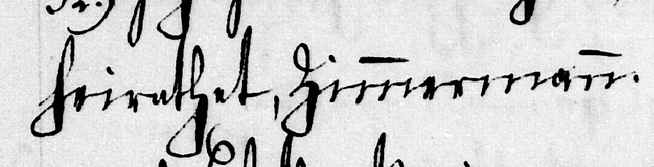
heirathet, Zimmermann.
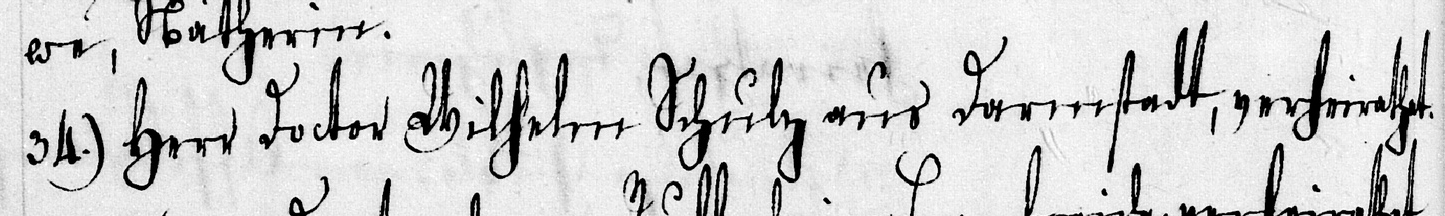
34.) Herr Doctor Wilhelm Schulz aus Darmstadt, verheirat¬
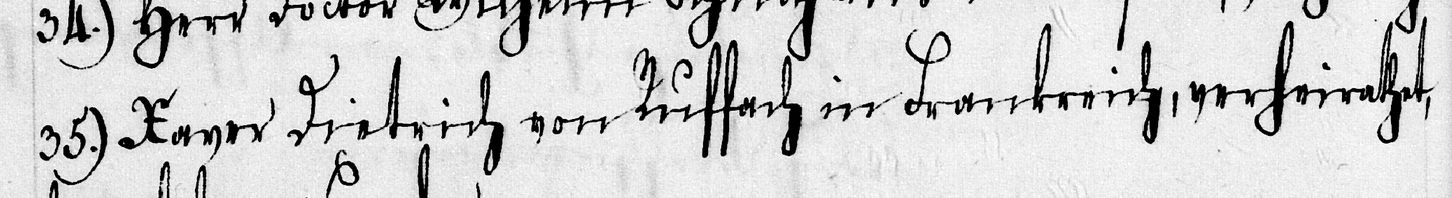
35.) Xaver Dietrich von Ruffach in Frankreich, verheirath¬
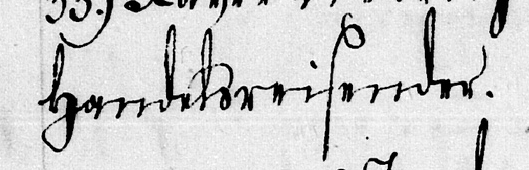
Handelsreisender.
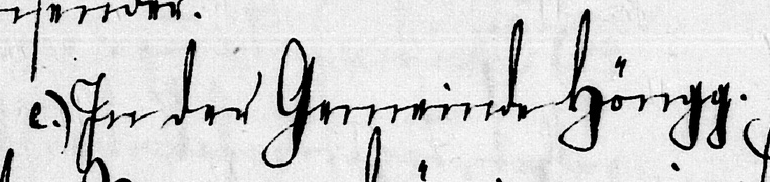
e.) In der Gemeinde Höngg.
